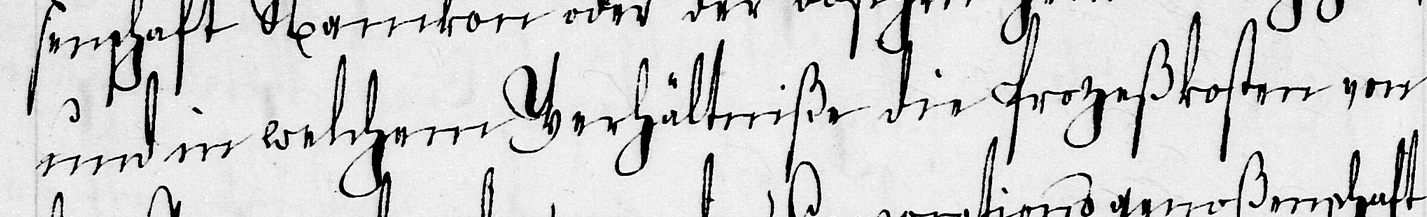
und in welchem Verhältniße die Prozeßkosten von
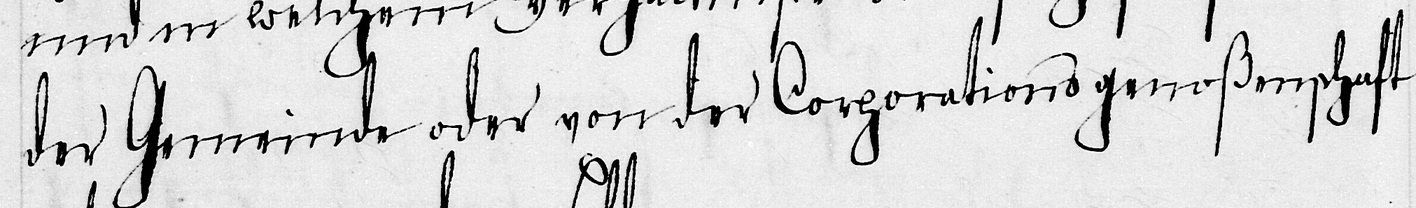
der Gemeinde oder von der Corporationsgenoßenschaft
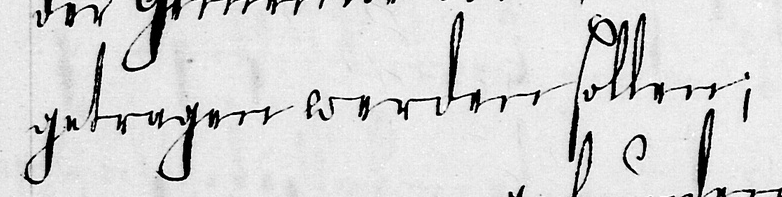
getragen werden sollen;
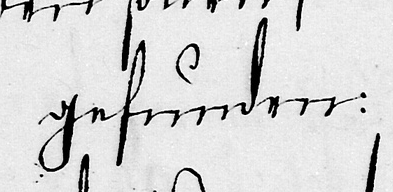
gefunden:
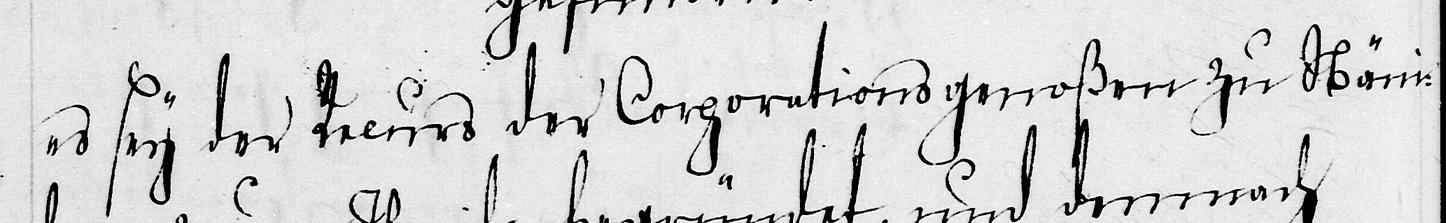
es sey der Recurs der Corporationsgenoßen zu Näni¬
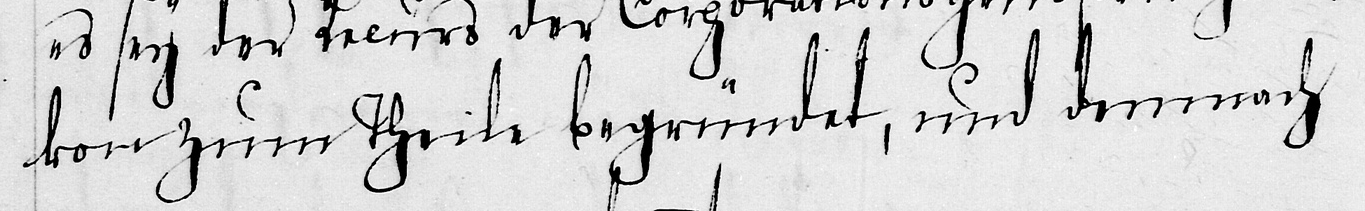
kon zum Theile begründet, und demnach
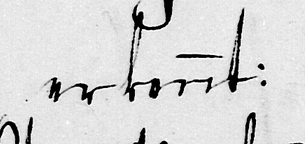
erkennt:
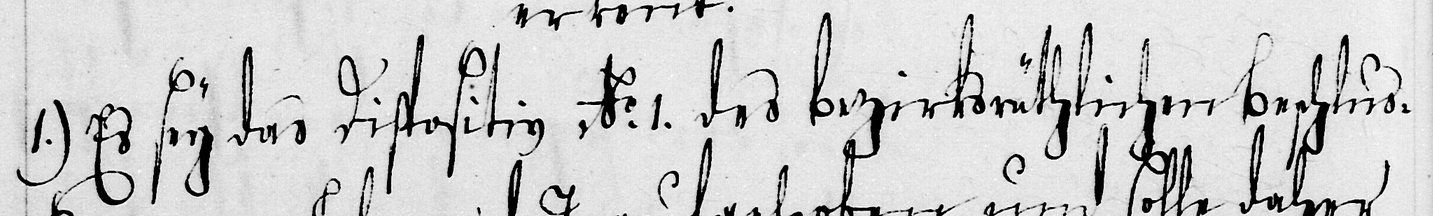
Es sey das Dispositiv No.1 des bezirksräthlichen Beschl¬
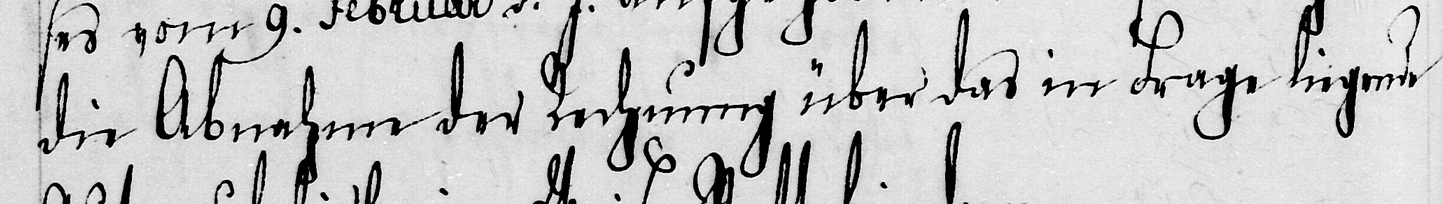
die Abnahme der Rechnung über das in Frage liegende
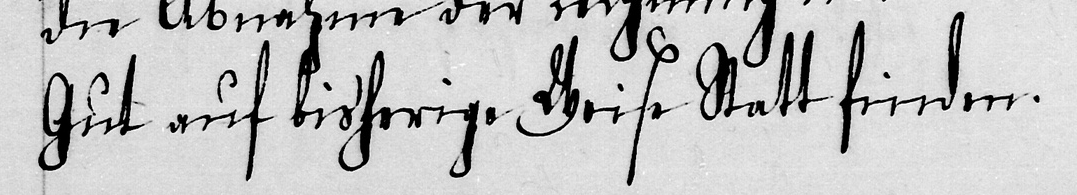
Gut auf bisherige Weise Statt finden.
